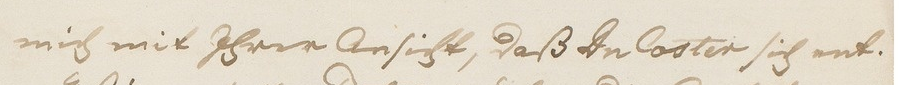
mich mit Ihrer Ansicht, dass Du Coster sich ent-
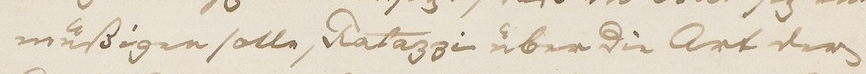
müßigen solle, Ratazzi über die Art der
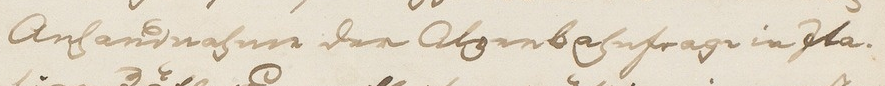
Anhandnahme der Alpenbahnfrage in Ita-
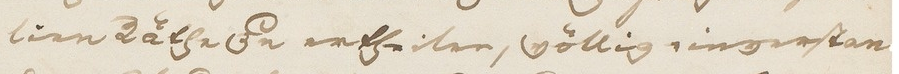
lien Räthe zu ertheilen, völlig einverstan-
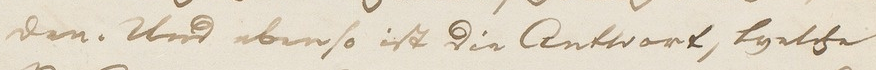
den. Und ebenso ist die Antwort, welche
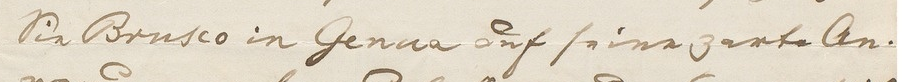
Sie Brusco in Genua auf seine zarte An-
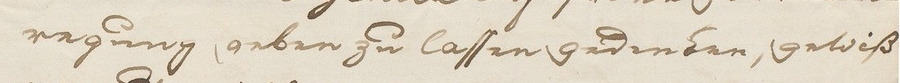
regung geben zu lassen gedenken, gewiß
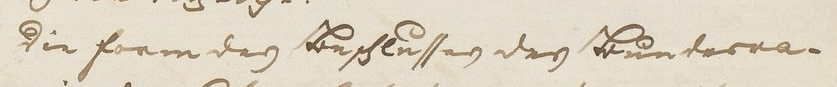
Die Form des Beschlusses des Bundesra-
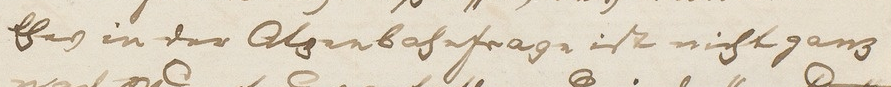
thes in der Alpenbahnfrage ist nicht ganz
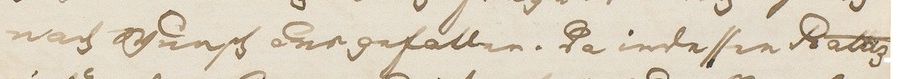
nach Wunsch ausgefallen. Da indessen Rataz-
